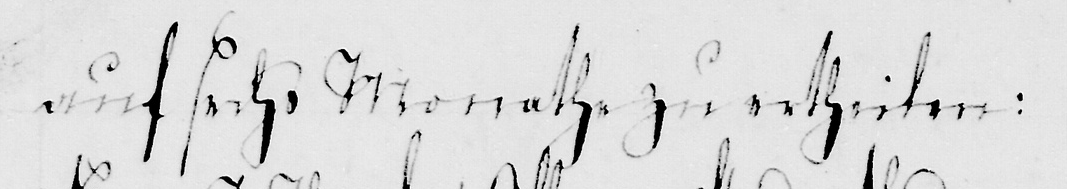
auf sechs Monathe zu ertheilen:
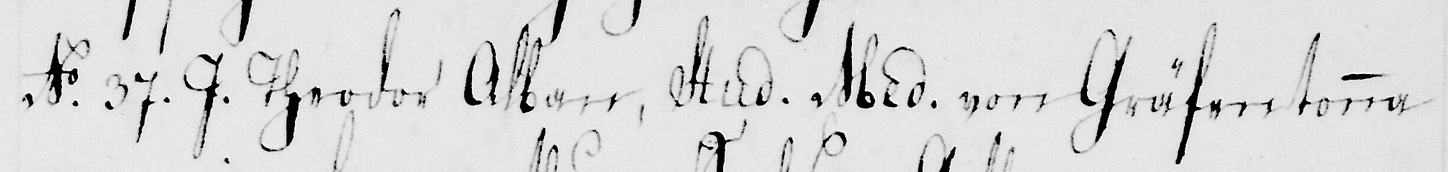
No. 37. J. Theodor Alban, Stud. Med. von Gräfentonna
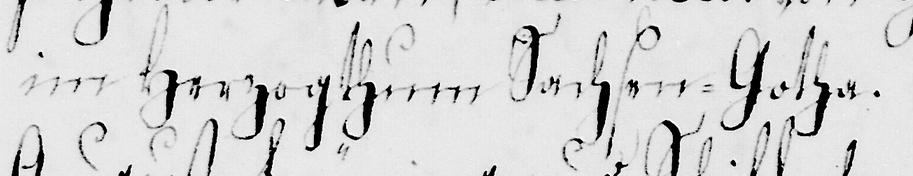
im Herzogthum Sachsen-Gotha.
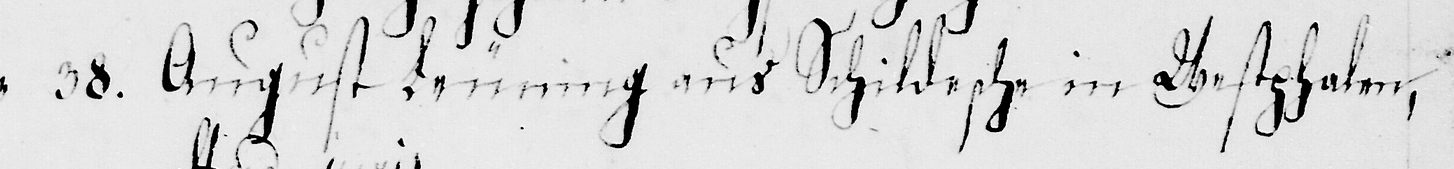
38. August Leuning aus Schildesche in Westphalen,
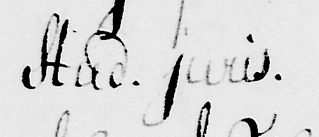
Stud. juris.
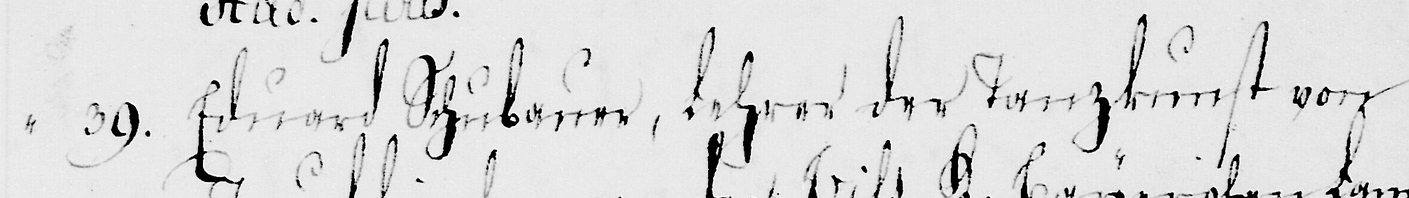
“ 39. Eduard Schubauer, Lehrer der Tanzkunst von
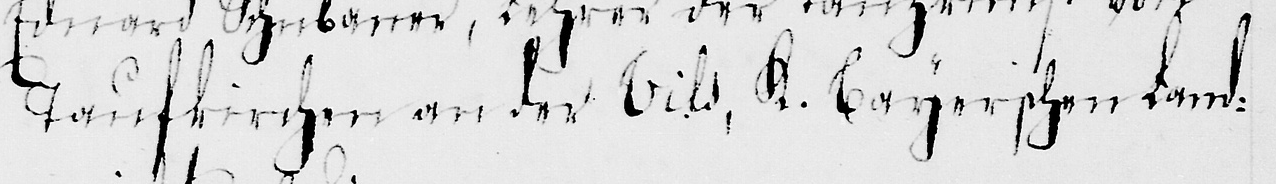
Taufkirchen an der Vils, K. Bayerischen Land¬
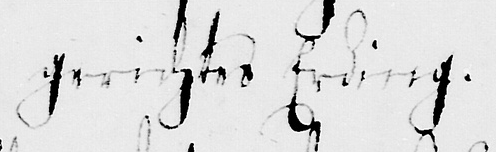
gerichtes Erding.
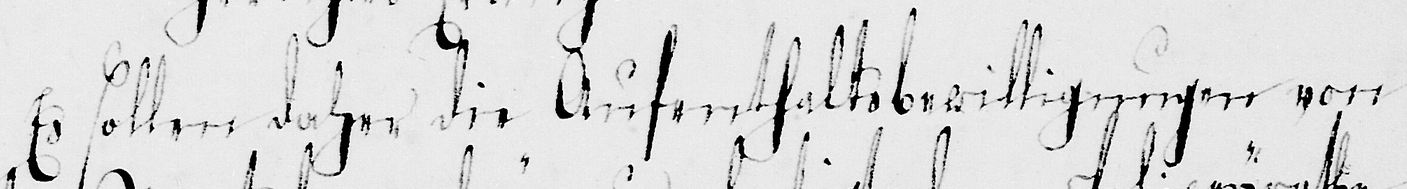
Es sollen die Aufenthaltsbewilligungen von
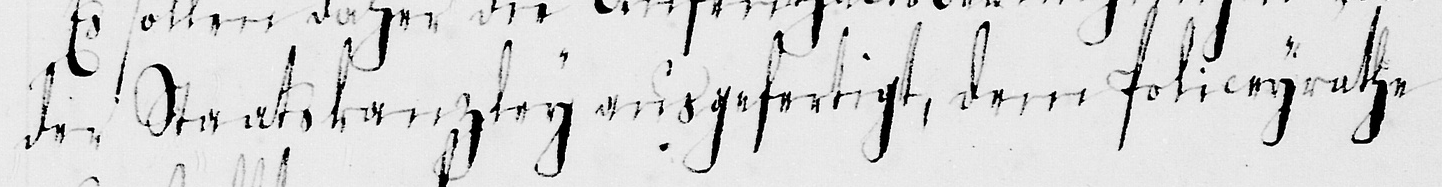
der Staatskanzley ausgefertigt, dem Policeyrathe
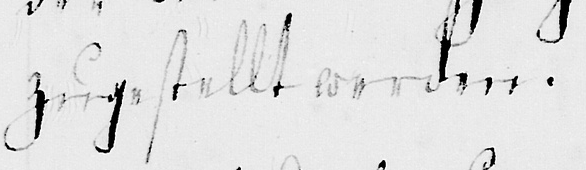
zugestellt werden.
